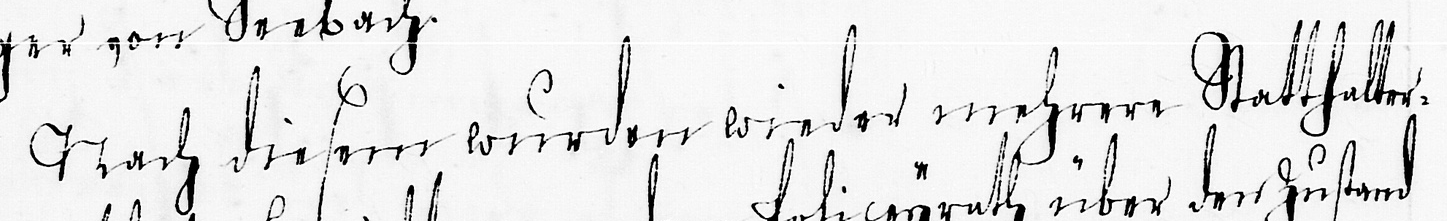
Nach diesem wurden wieder mehrere Statthalt¬
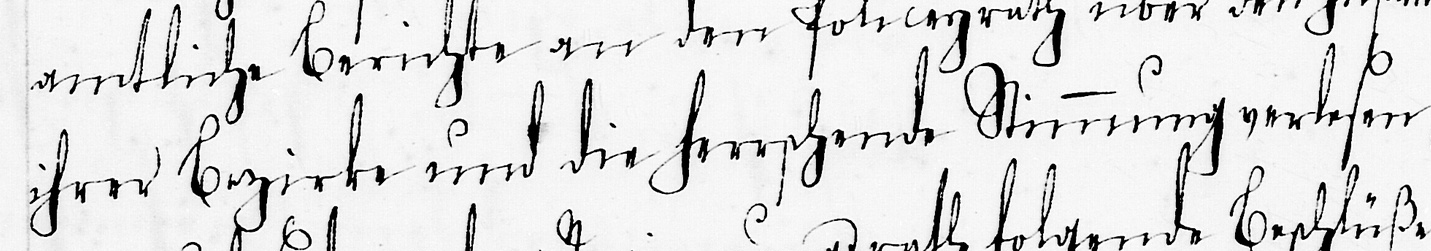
ihrer Bezirke und die herrschende Stimmung verlesen,
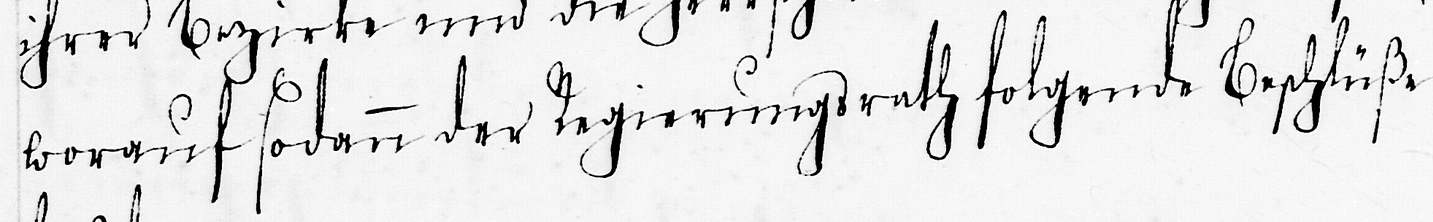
worauf sodann der Regierungsrath folgende Beschlüße
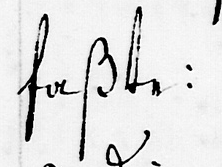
faßte:
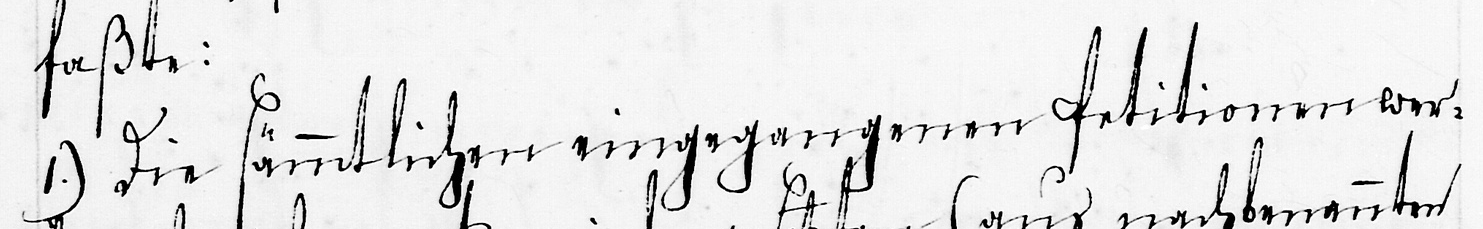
1.) Die sämmtlichen eingegangenen Petitionen wer¬
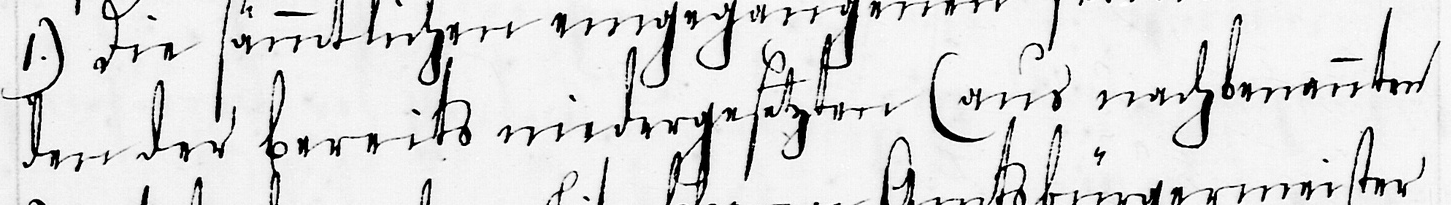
den der bereits niedergesetzten (aus nachbenannten
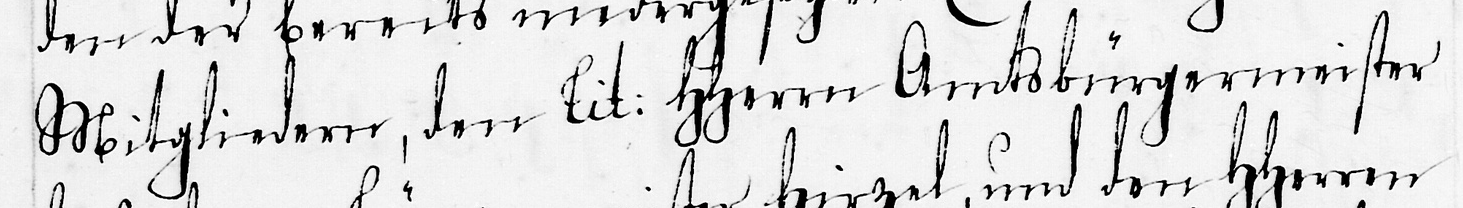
Mitgliedern, den Tit: HHerrn Amtsbügermeister
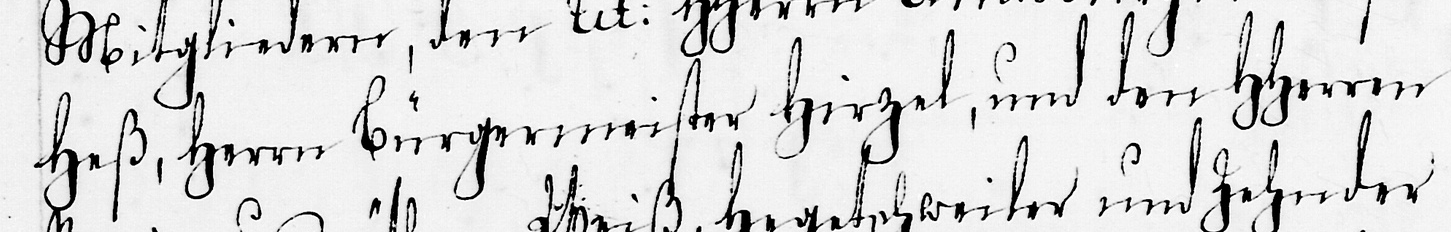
Heß, Herrn Bürgermeister Hirzel, und den HHerren
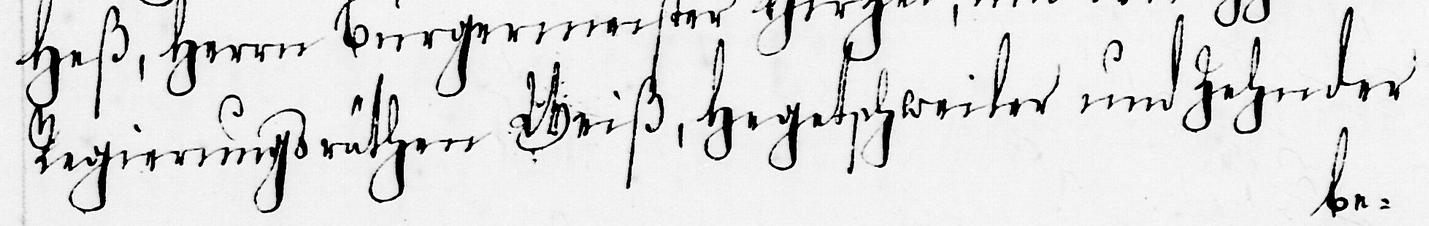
Regierungsräthen Weiß, Hegetschweiler und Zehnder
